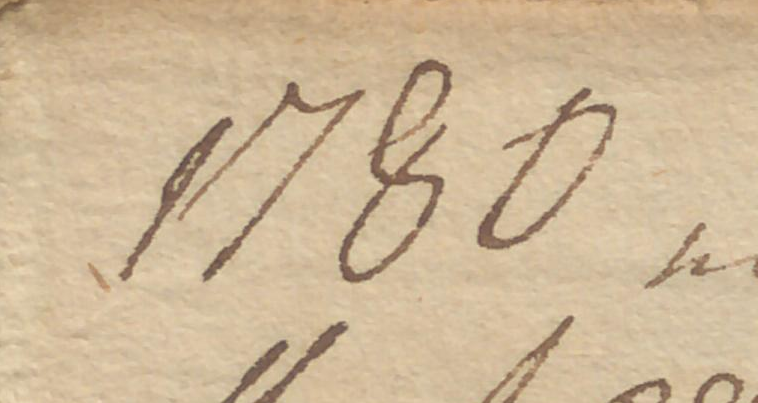1780
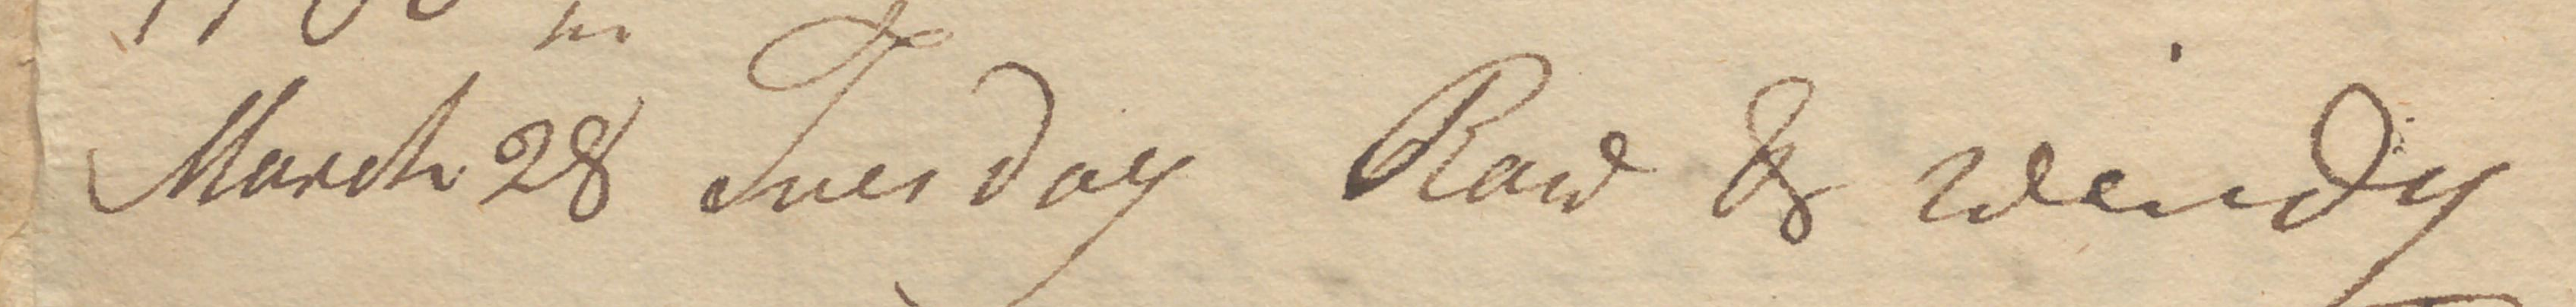March 28^th Tuesday Raw & windy
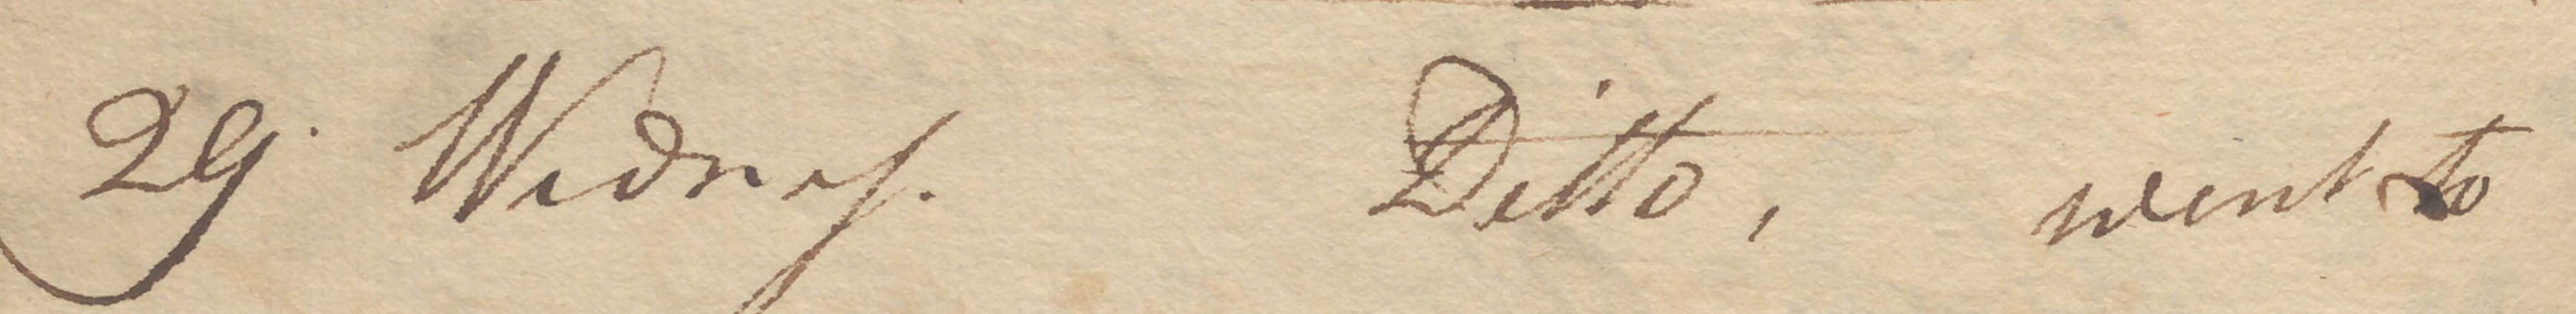29h. Wednes. Ditto, went to
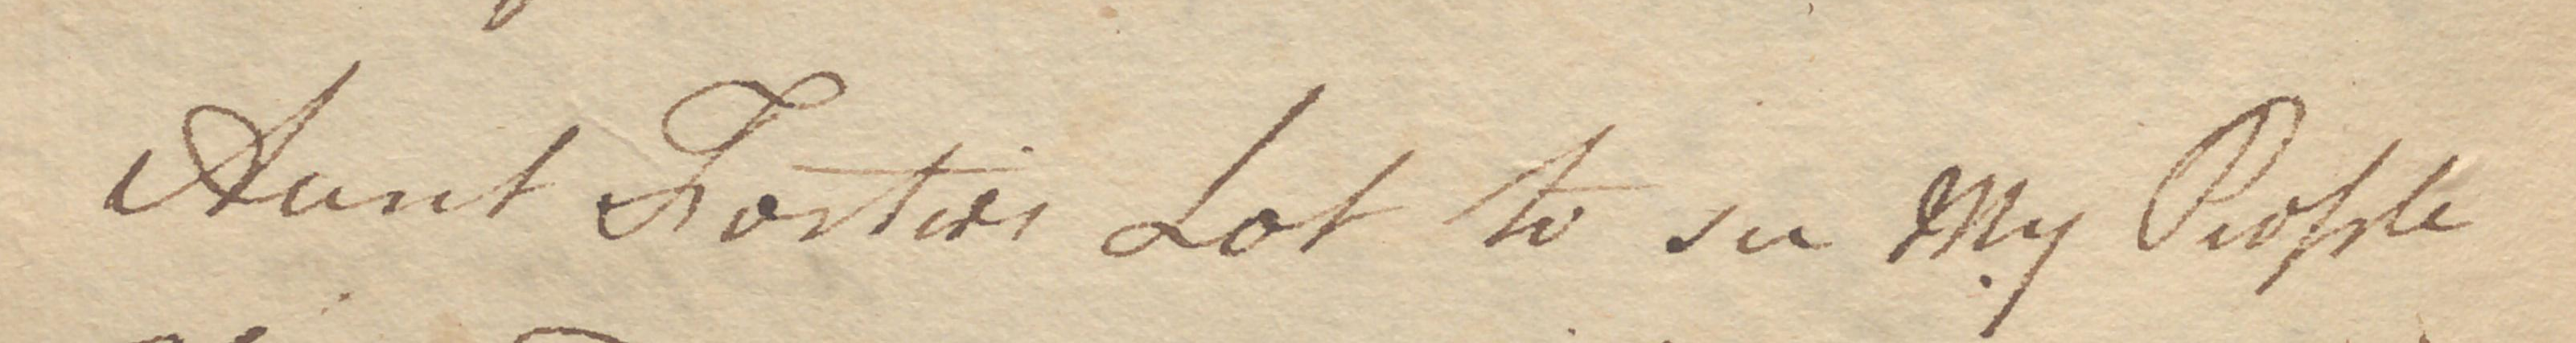Aunt Forters Lot to see My People
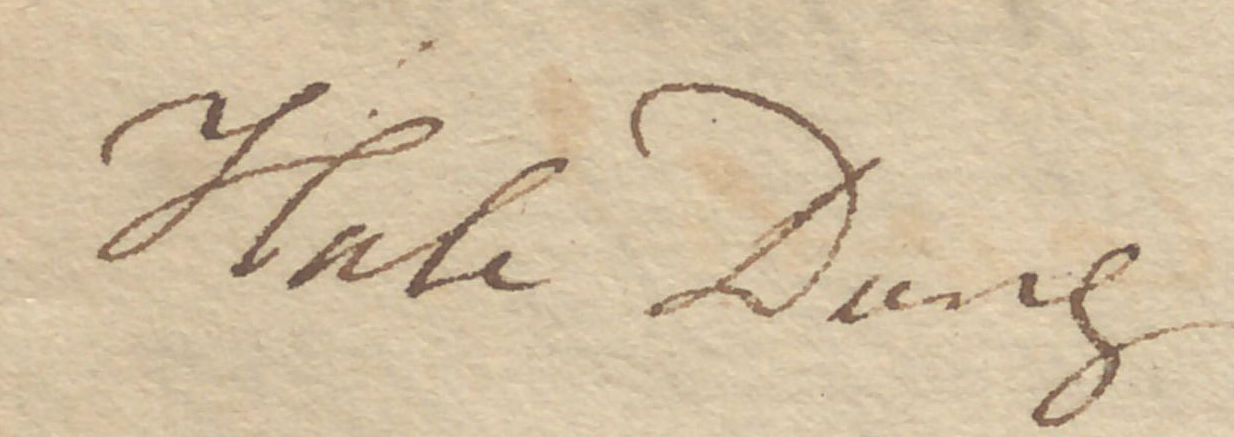Hale Dung
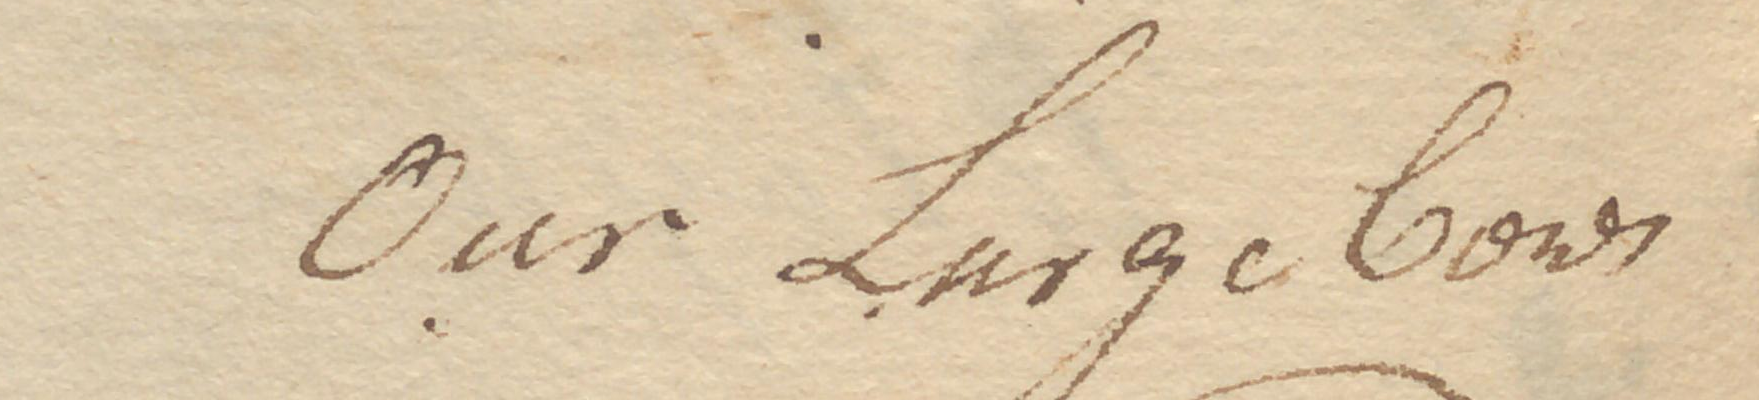Our Large Cows
